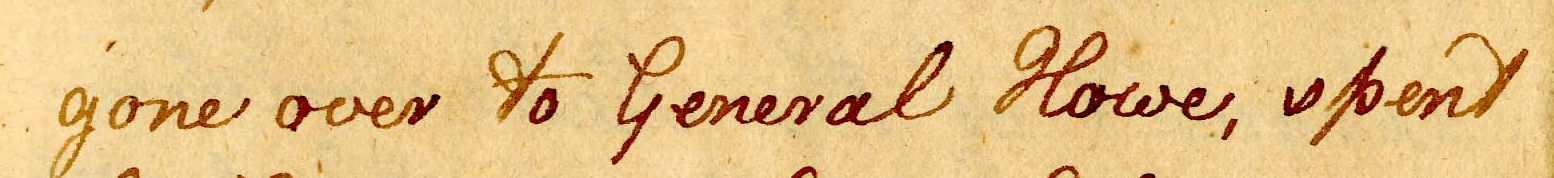gone over to General Howe, spent
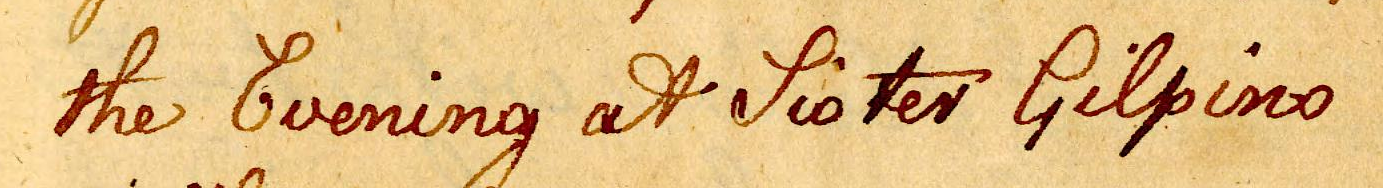the Evening at Sister Gilpins
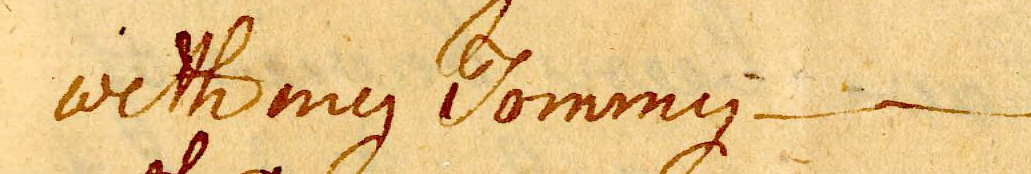with my Tommy-
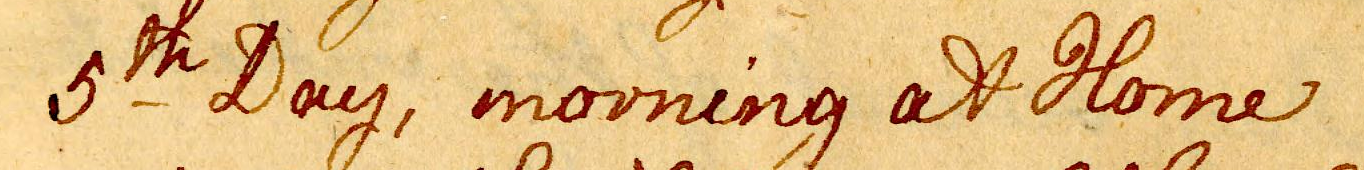5^th Day, morning at Home
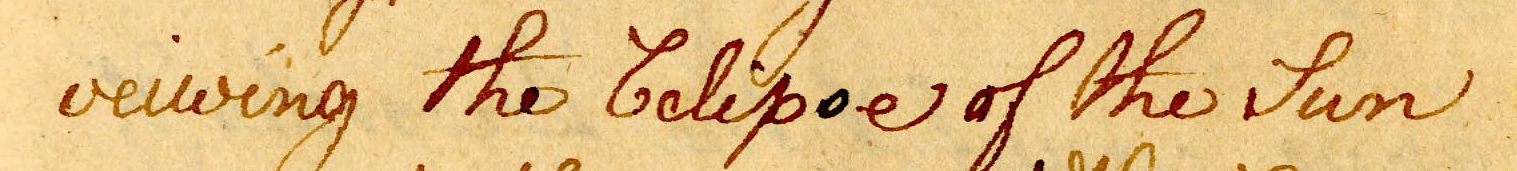veiwing the Eclipse of the Sun
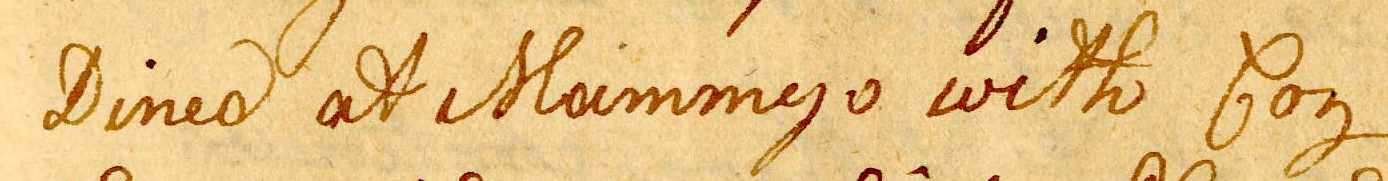Dined at Mammys with Coz
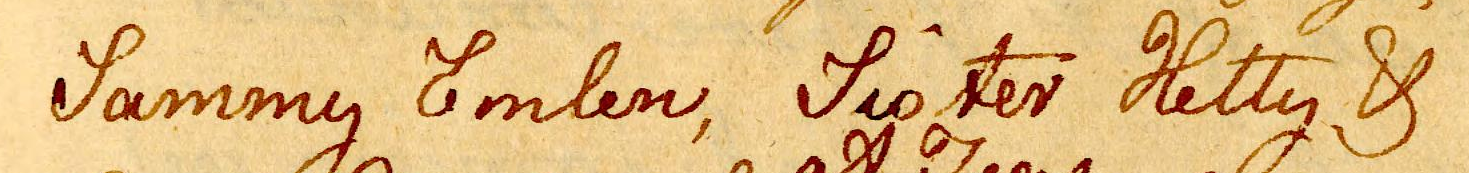Sammy Emlen, Sister Hetty &
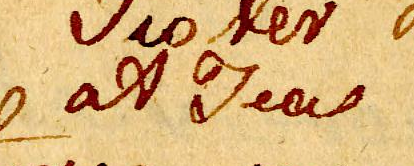at Tea
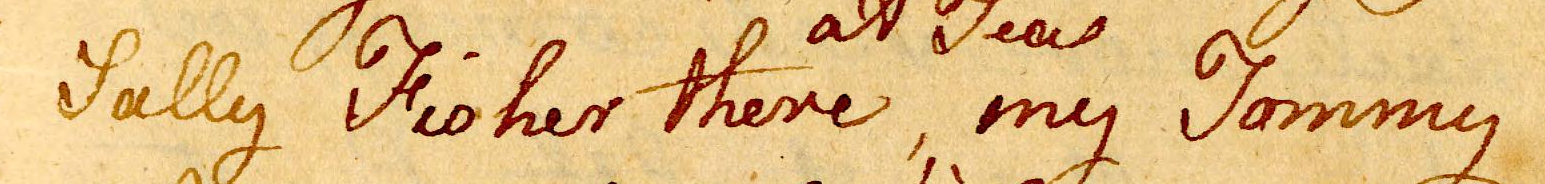Sally Fisher there, ^ my Tommy
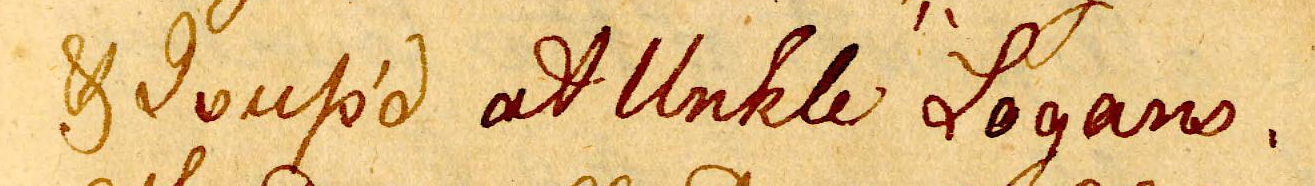& I sup'd at Unkle Logans,
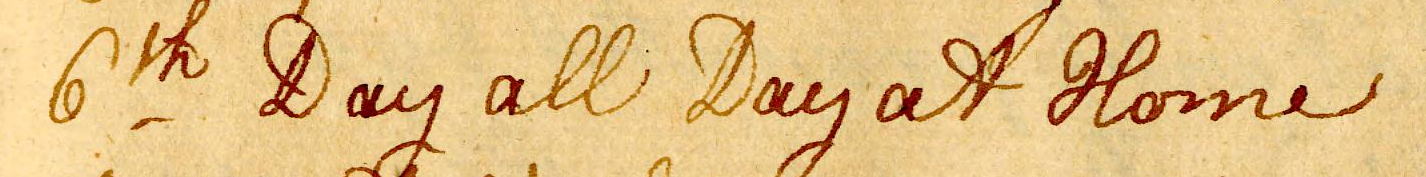6^th Day all Day at Home
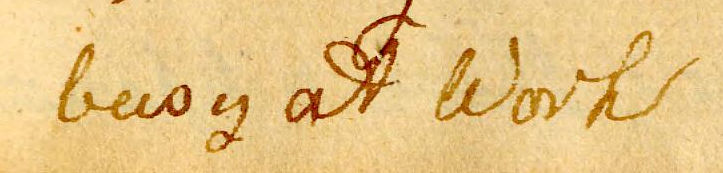busy at Work
